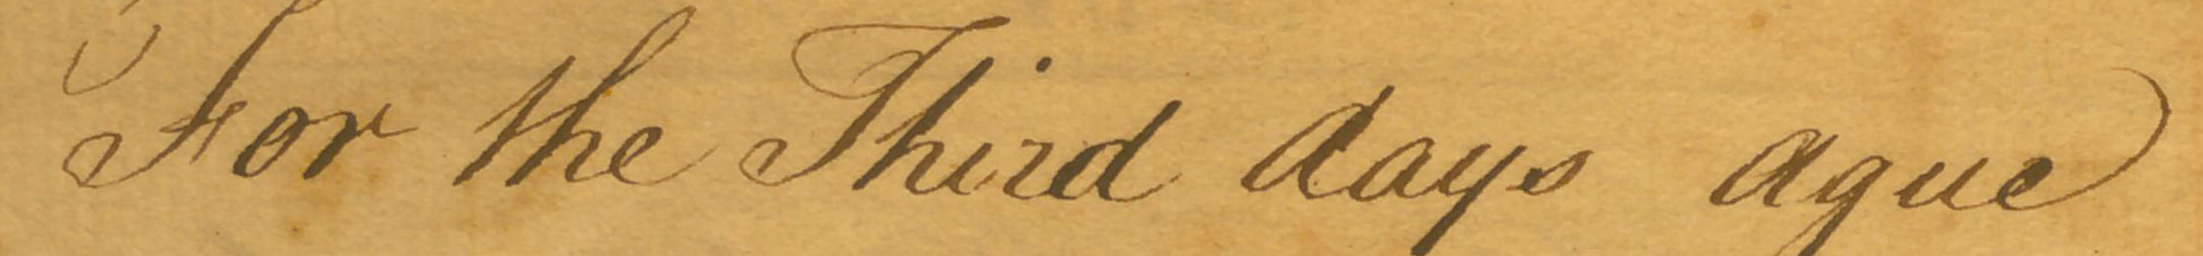For the Third days ague
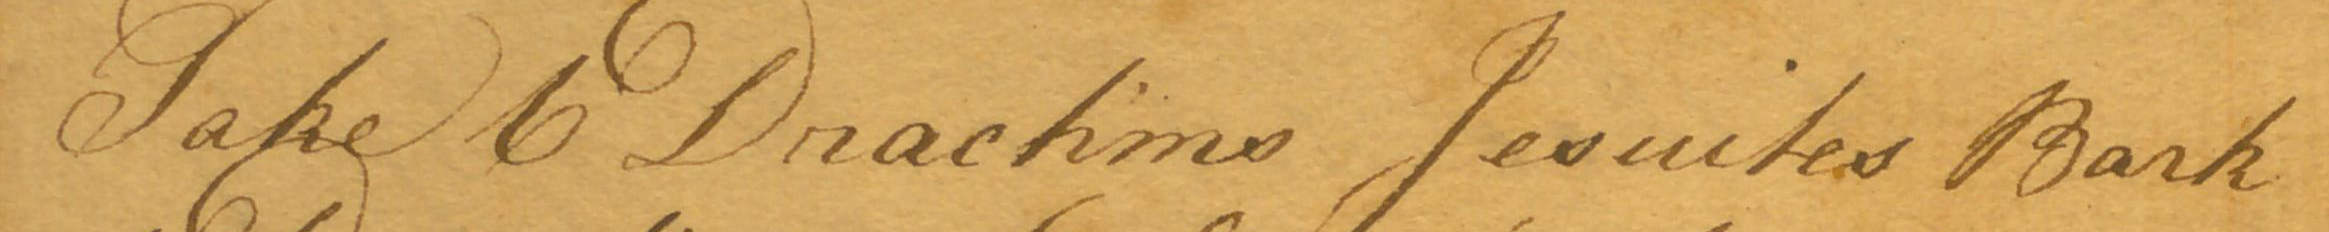Take 6 Drachims Jesuites Bark
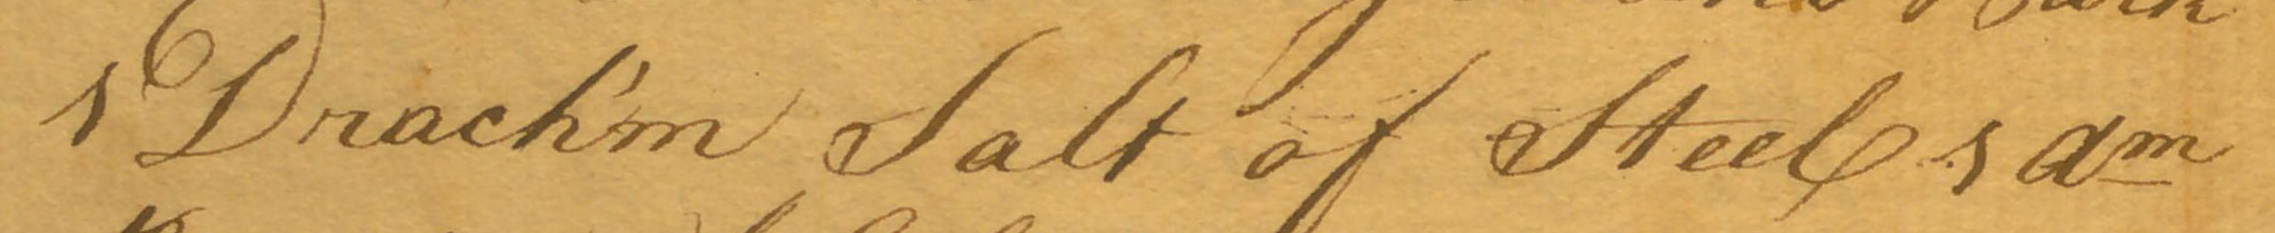1 Drachim Salt of Steel 1 d^m
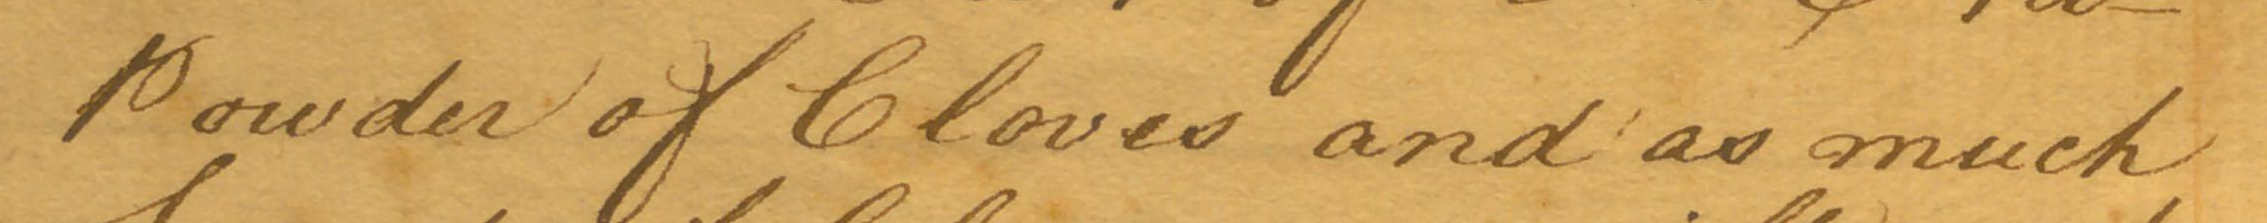Powder of Cloves and as much
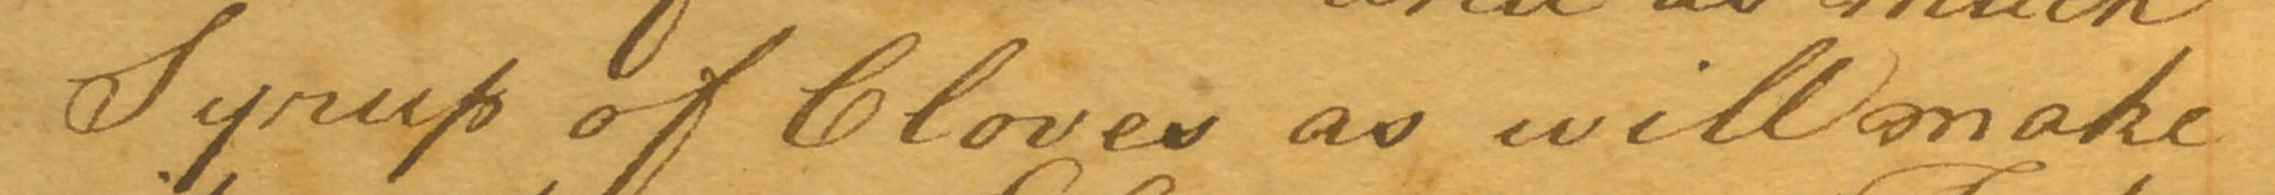Syrup of Cloves as will make
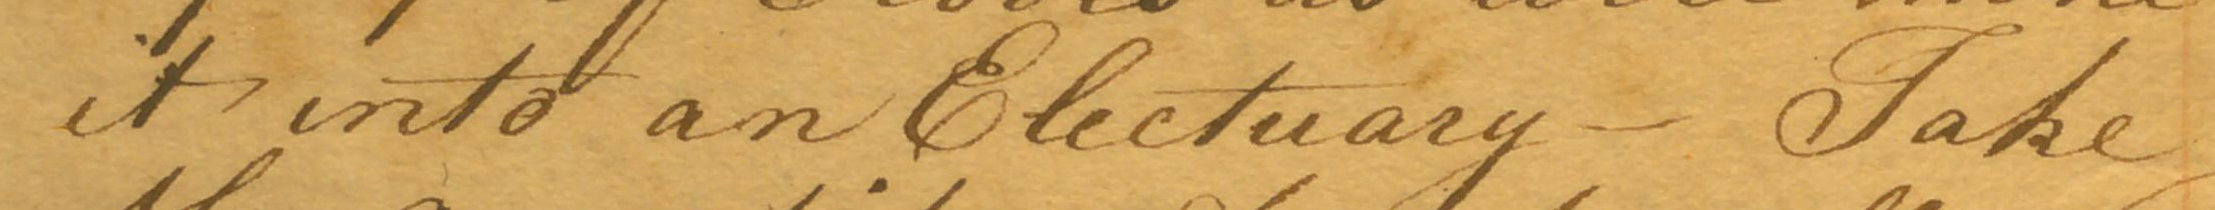it into an Electuary- Take
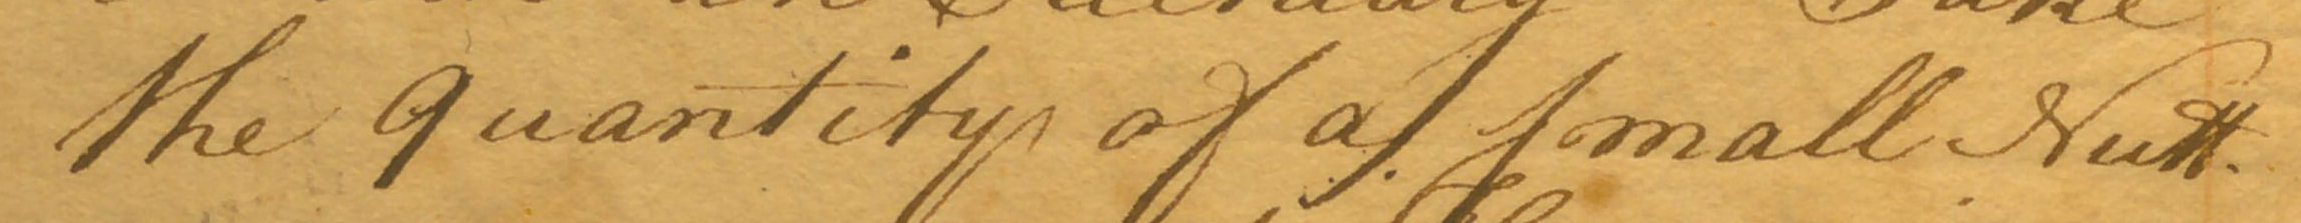the quantity of a small Nutt
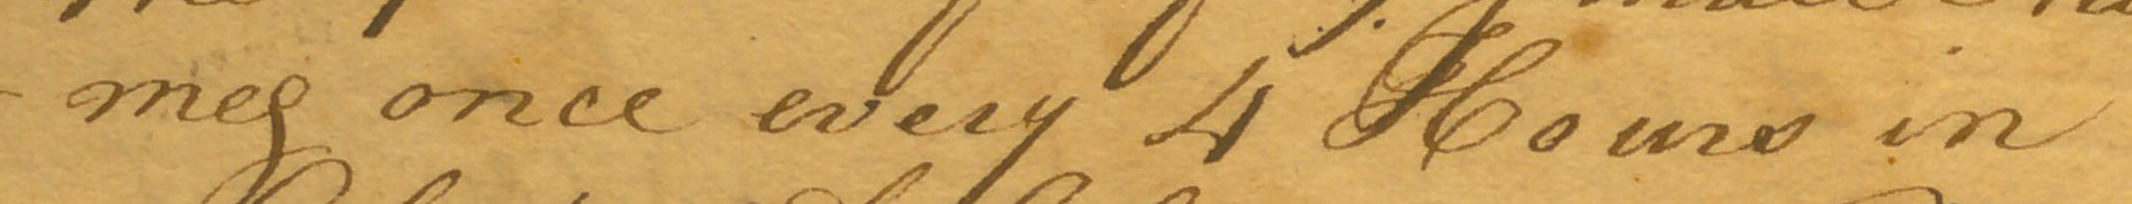meg once every 4 Hours in
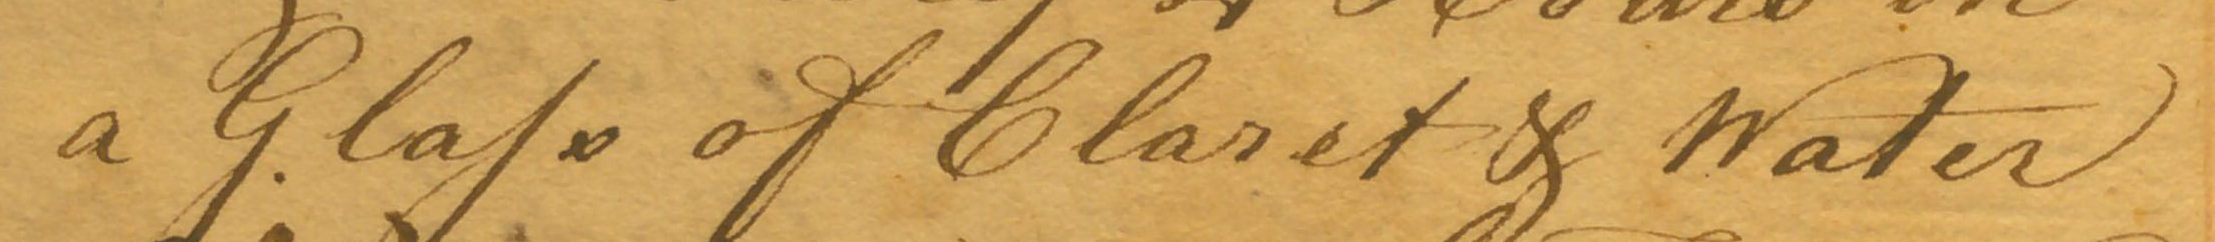a Glass of Claret & Water
